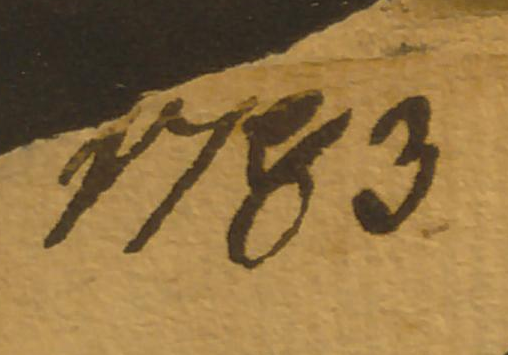1783
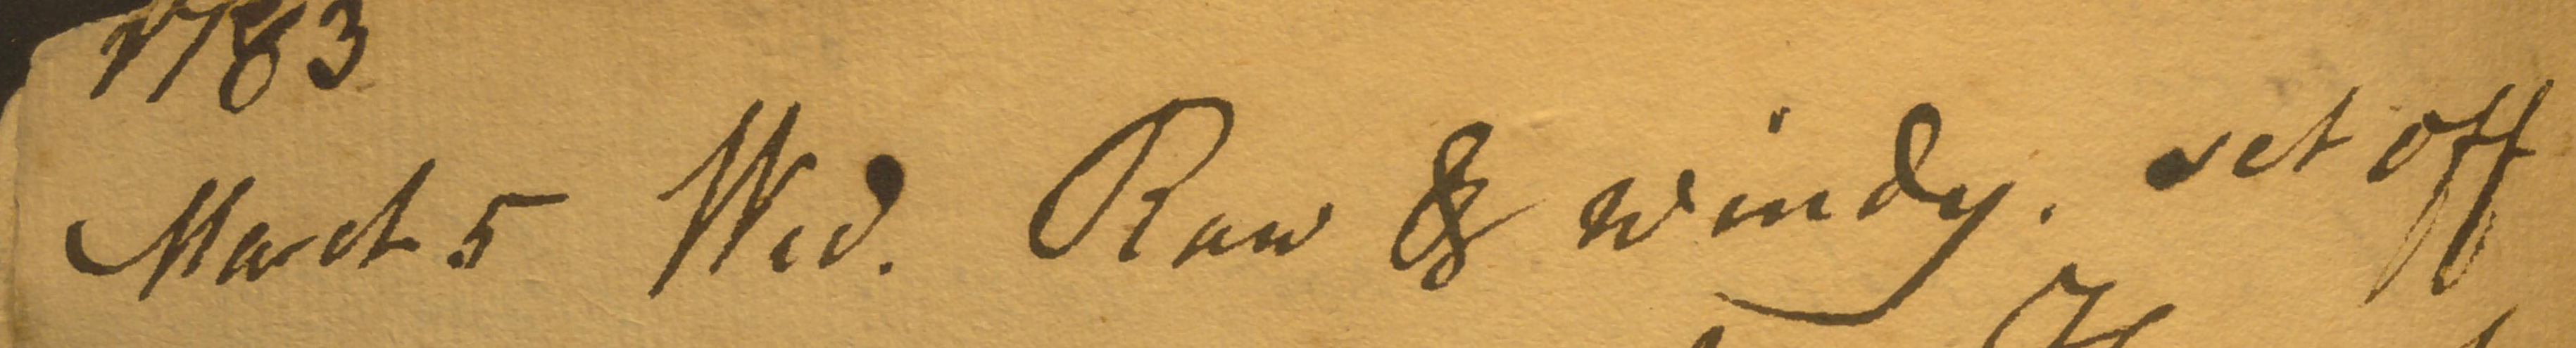March 5 Wed. Raw & windy. set off
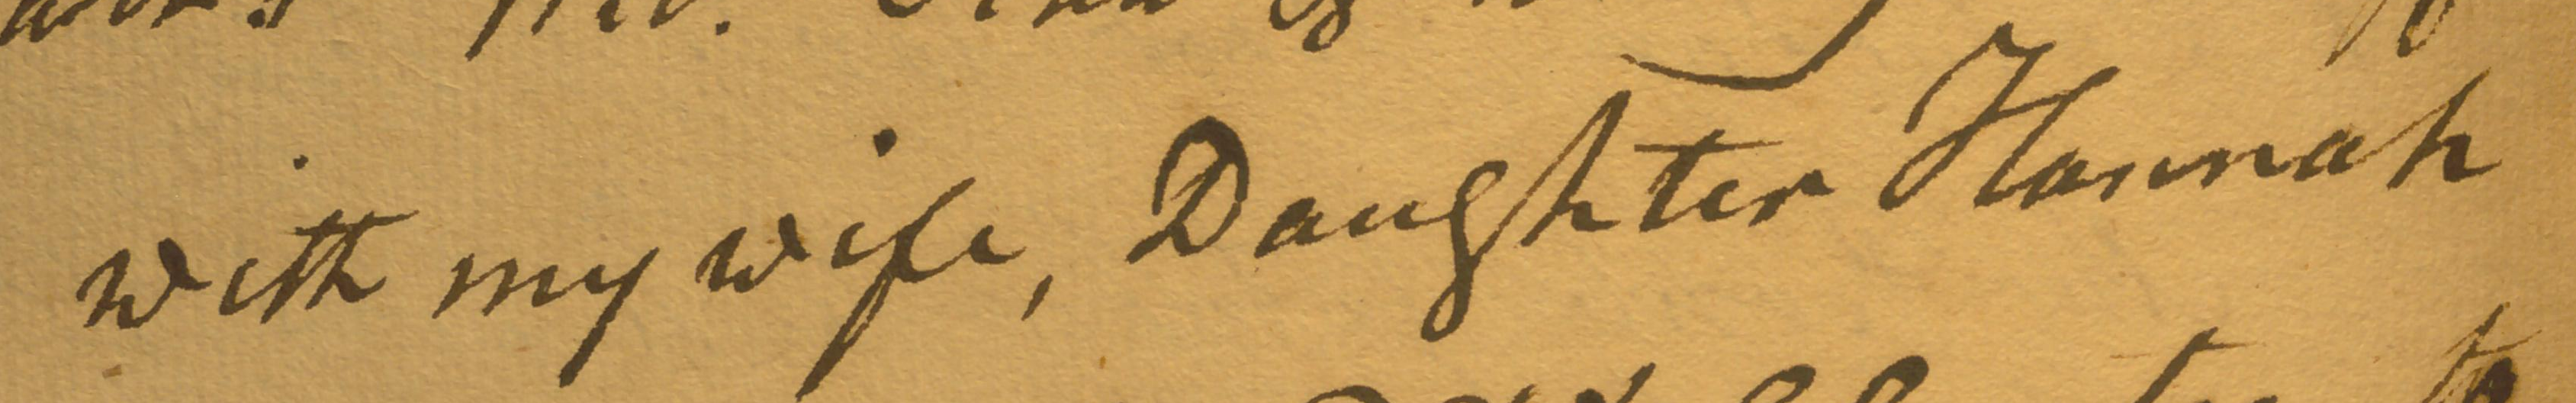with my wife, Daughter Hannah
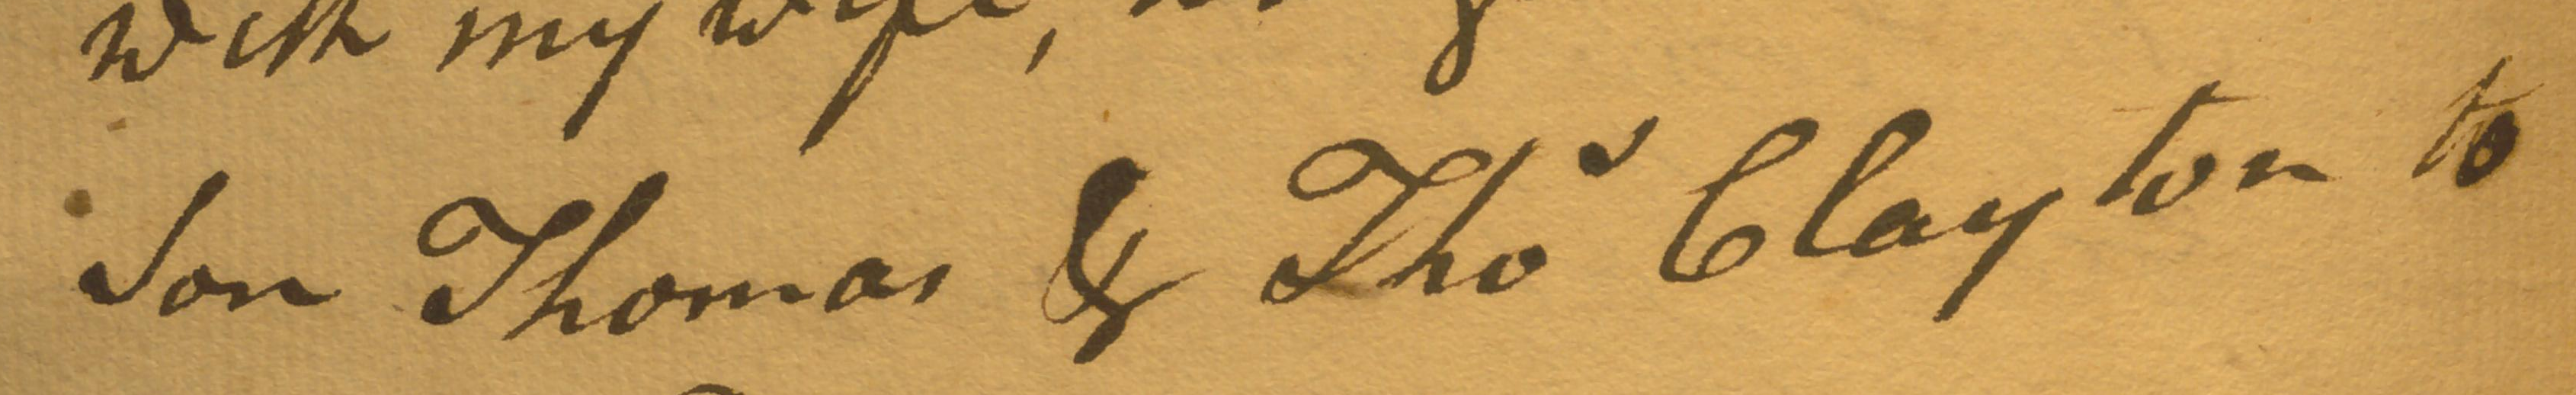Son Thomas & Tho^s Clayton to
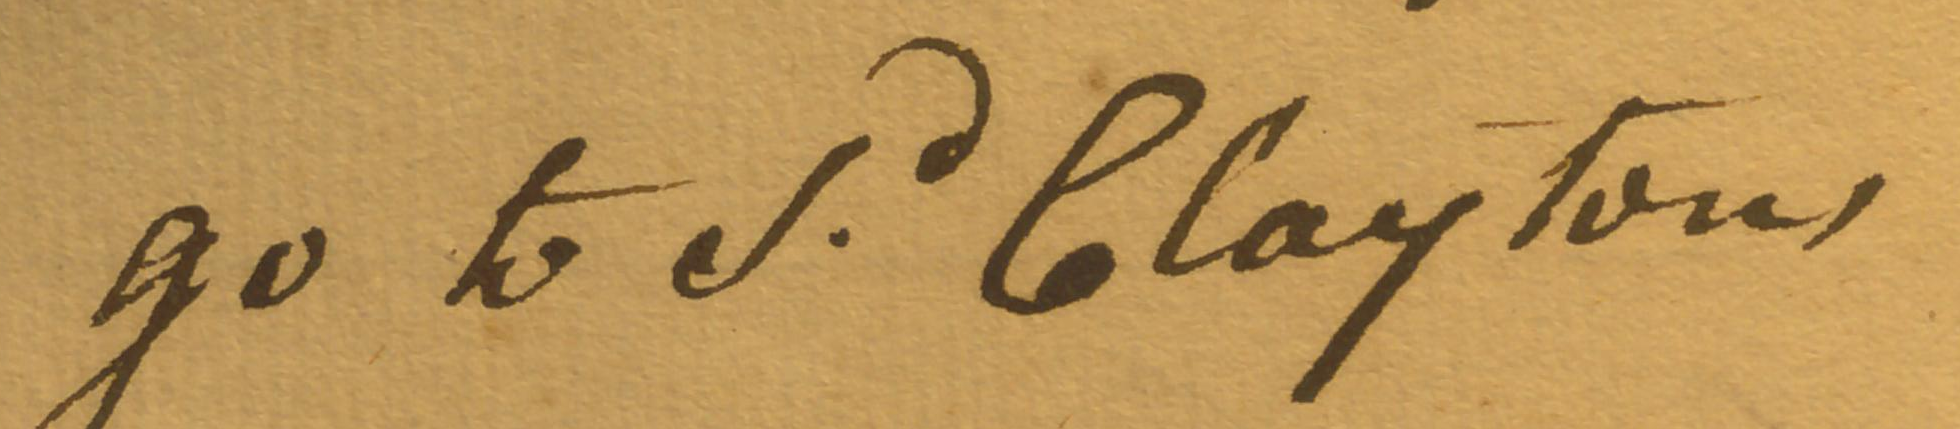go to s^d. Claytons
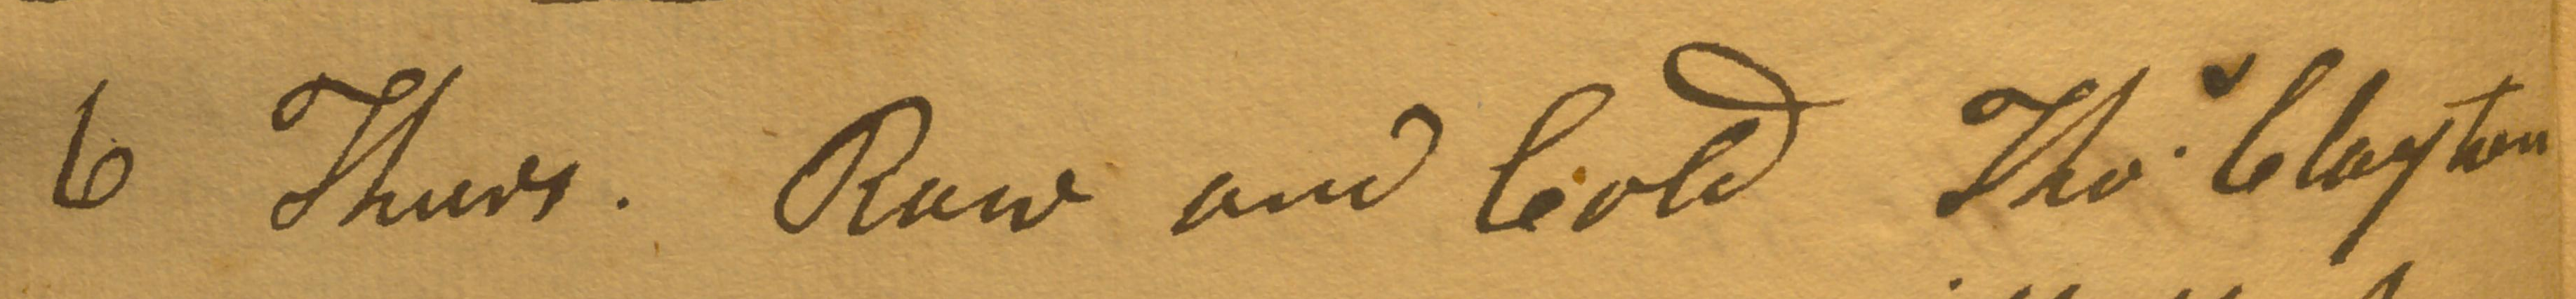6 Thurs. Raw and Cold, Tho^s. Clayto
